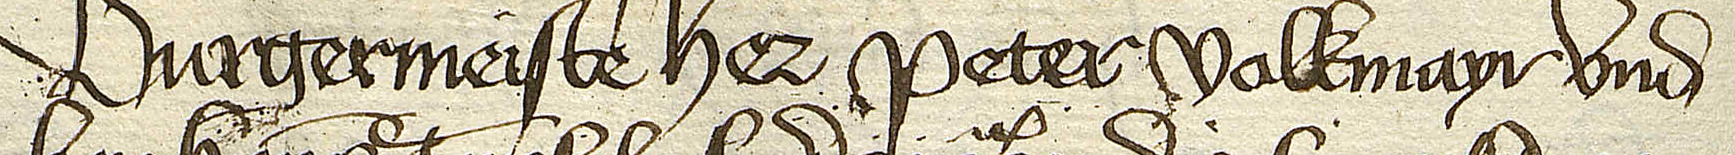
Burgermeiſte* her Peter volkmayr Vnd
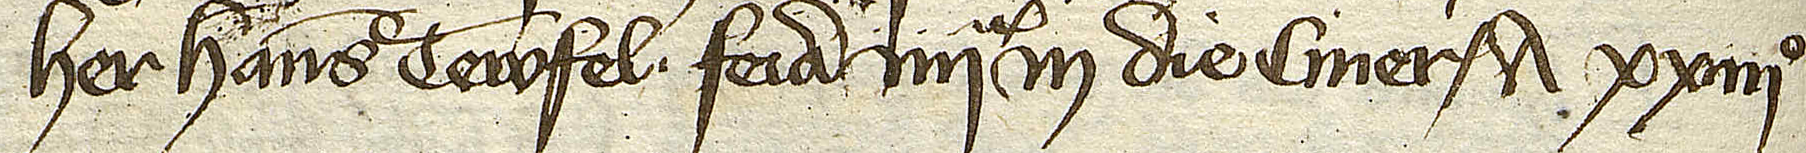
her hans Tewfel . fe*ia iiii* in die Ciner* A xxiii*
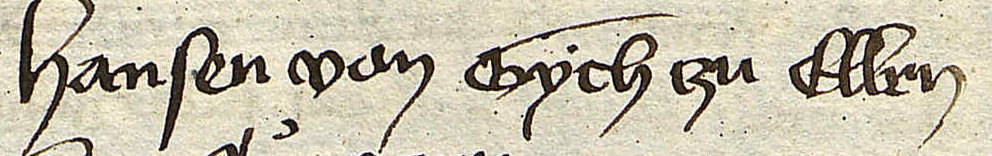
Hanſen von Gych cʒu Ellrn
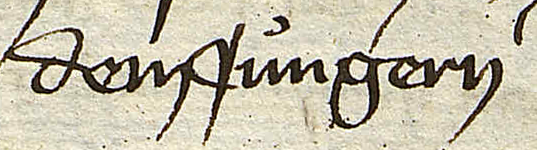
dem Iüngern
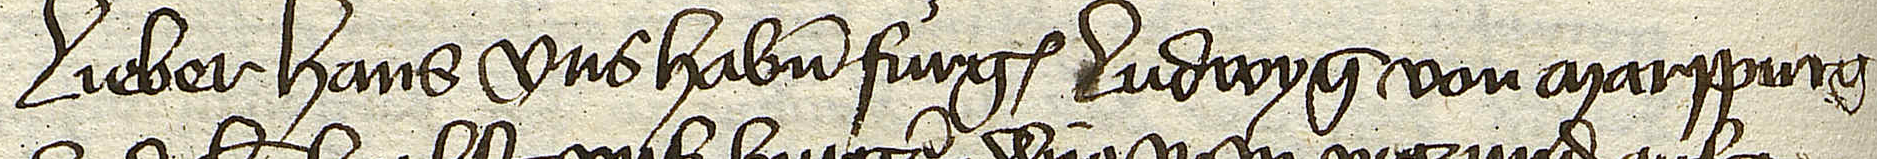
Lieber Hans vns hab*n fürg* Ludwyg von Marppurg
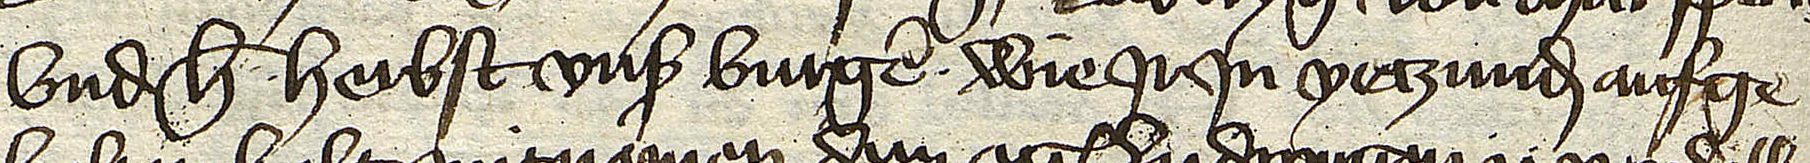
vnd h* herbſt vnſ* burge*. wie Ir In yecʒund* aufge
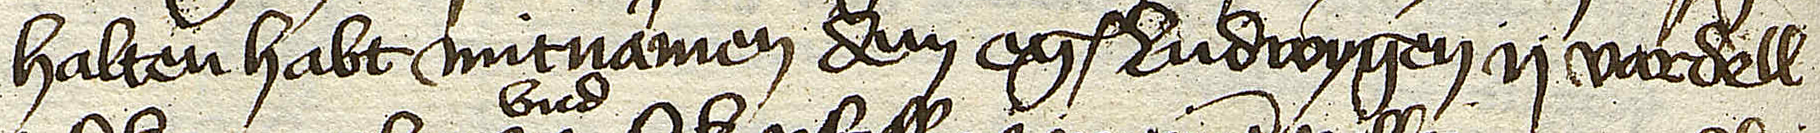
halten habt mitnamen den eg* Ludwygen ii vardell
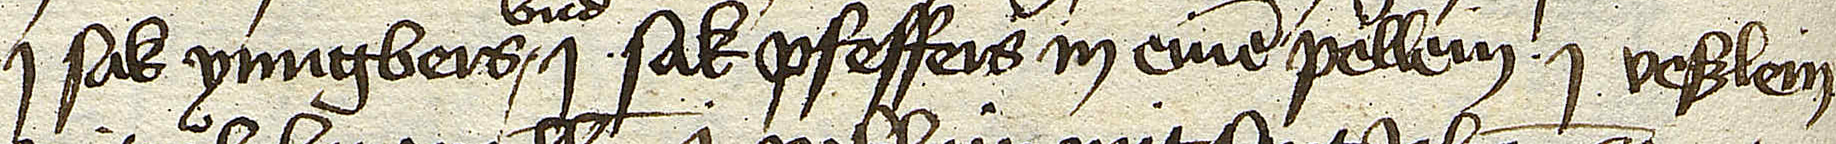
i ſak ynngbers / i ſak pfeffers in eine* pellein . i veſʒlein
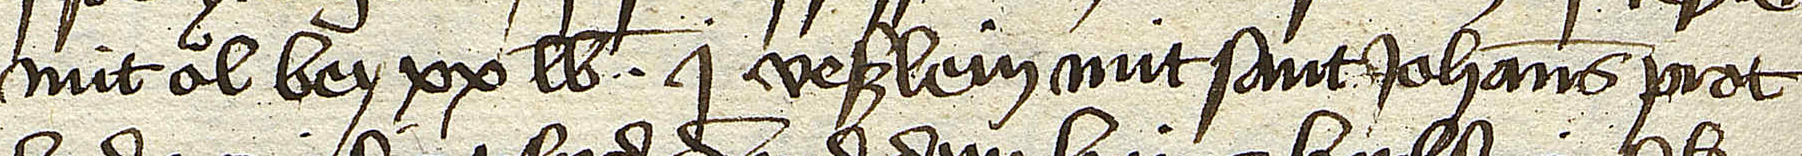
mit öl bey xx lb . i veſʒlein mit ſant Iohans* prot
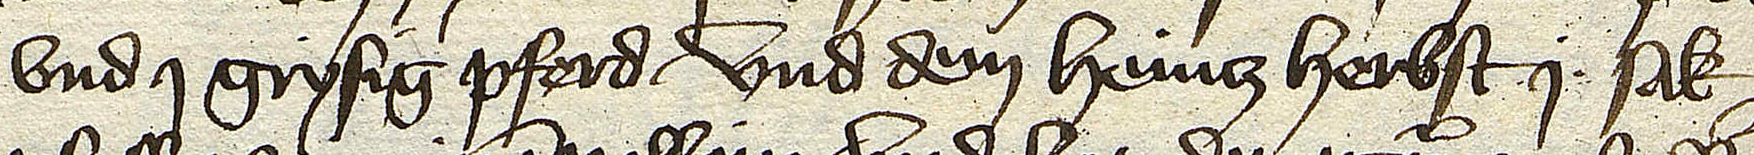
vnd i gryſig pferd / Vnd dem heincʒ herbſt . i . ſak
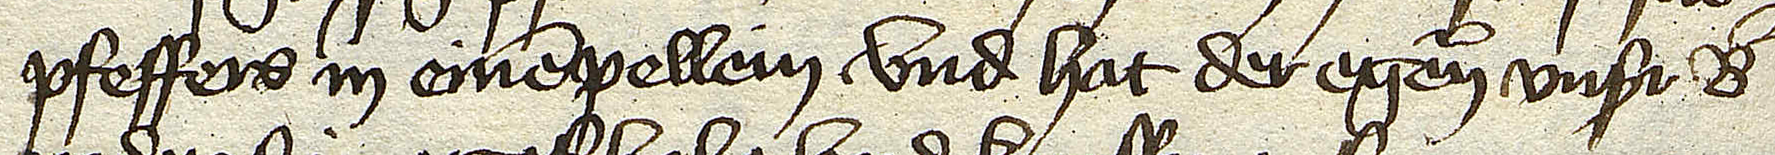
pfeffers in eine* pellein / Vnd hat der egen* vnſ*r B*
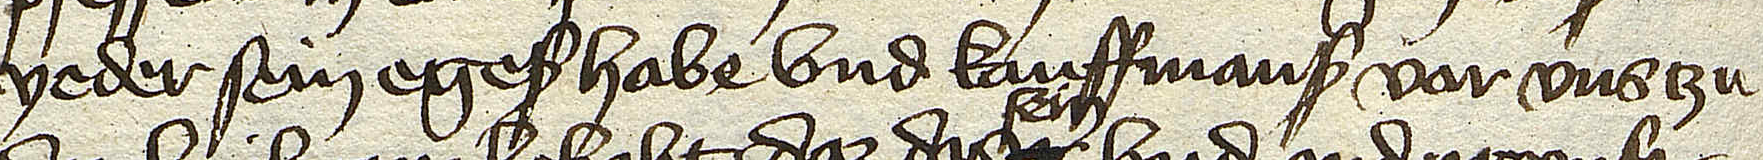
yeder ſein egeſ* habe vnd kauffmanſ* vor vns cʒu
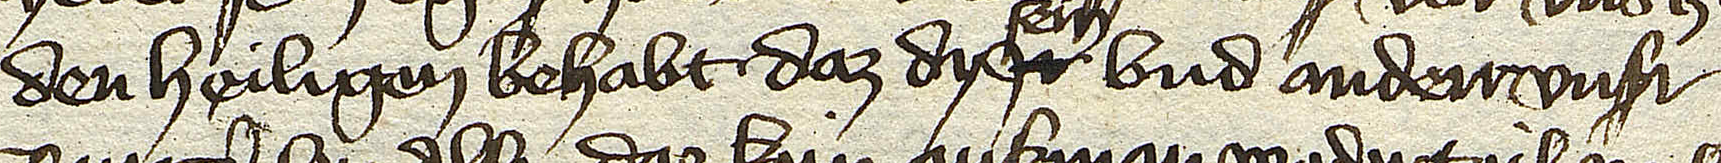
den heiligen behabt / daʒ dy Ir vnd anderr vnſ*r
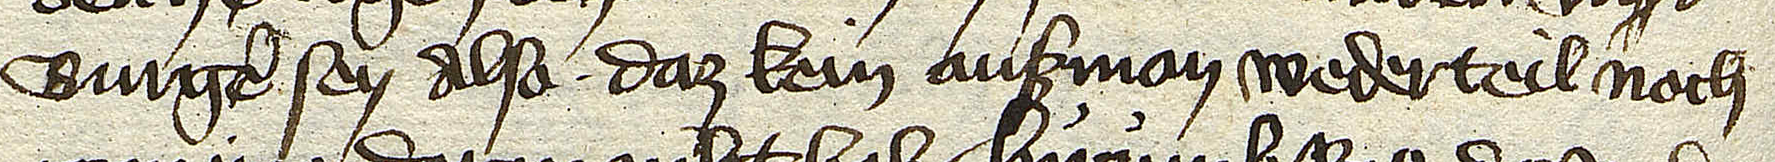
burge* ſey Alſo . daʒ kein auſʒman weder teil noch
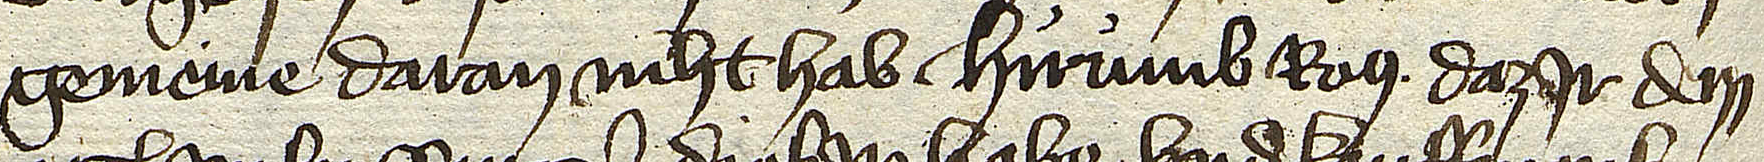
gemeine daran niht hab / Hirümb Ro* . daʒ Ir den
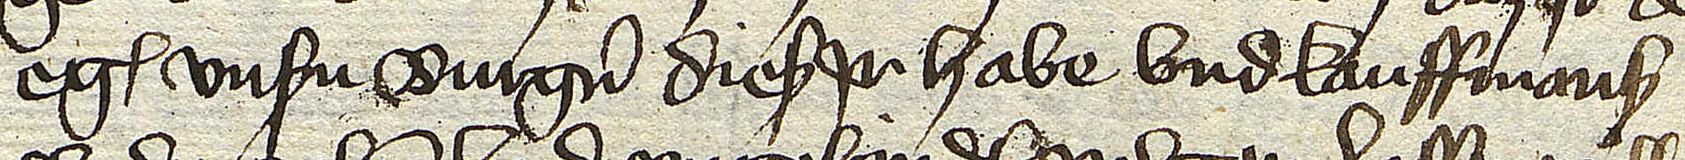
eg* vnſ*n burg*n dieſ* Ir habe vnd kauffmanſ*
